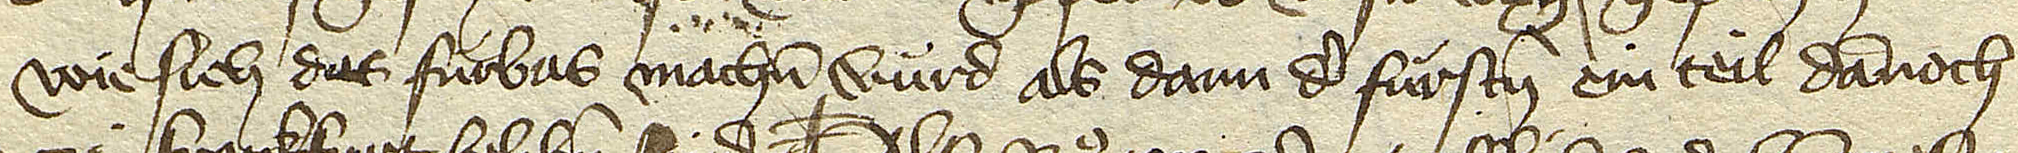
wie ſich das fürbas machn* würd als dann d* fürſtn* ein teil dan*och
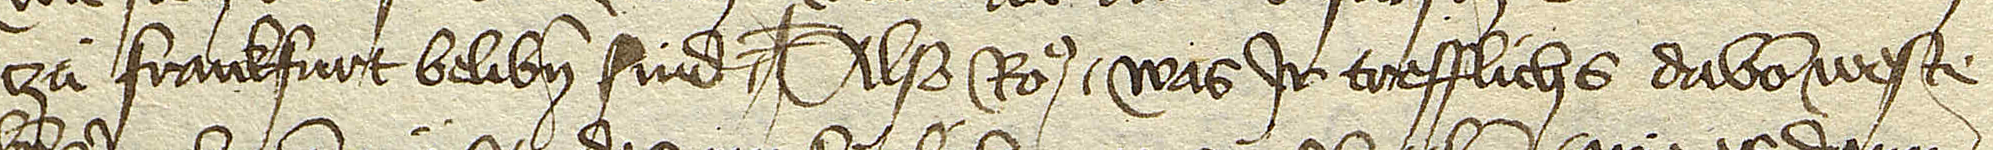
cʒü frankfurt belibn* ſind / Alſo Ro* / was Ir trefflichs davo* weſte
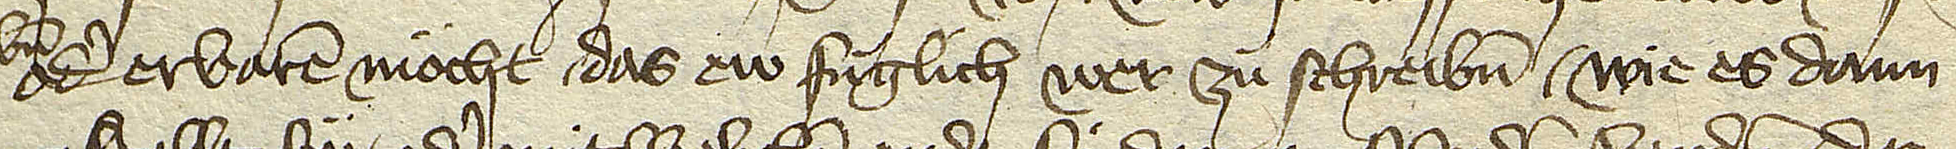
od* ervare* möcht / das ew füglich wer cʒü ſchreibn* / wie es dann
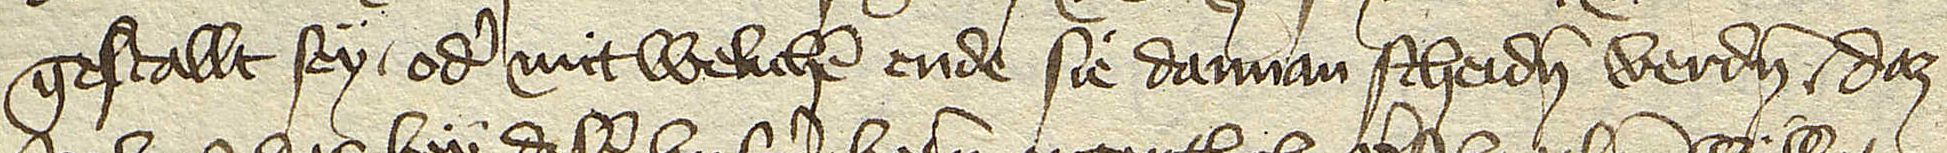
geſtallt ſey / od* mit weliche* ende ſie dannan ſcheidn* werdn* / daʒ
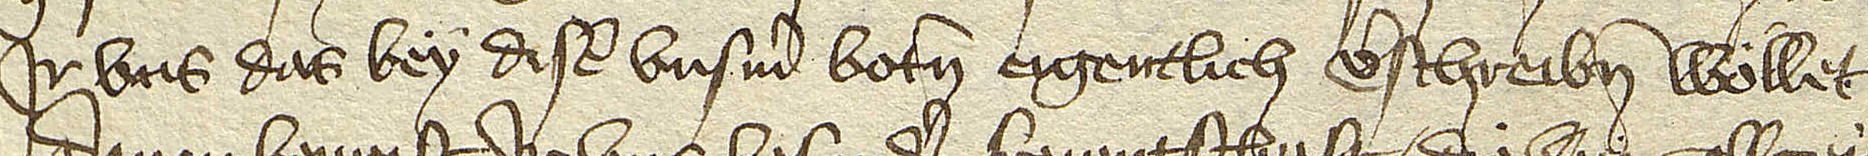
Ir vns das bey diſe* vnſm* botn* eigentlich v*ſchreibn* wöllet
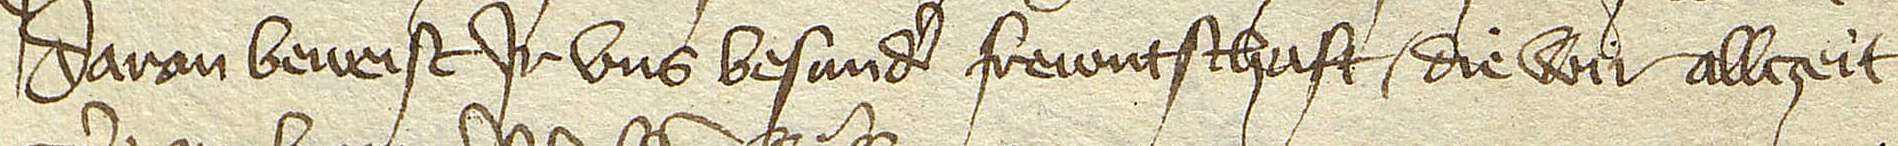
Daran beweiſt* Ir vns beſund* frewntſchaft / die wir allcʒeit
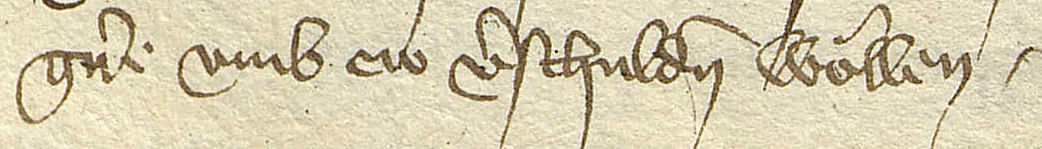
gn*e vmb ew v*ſchuldn* wöllen /
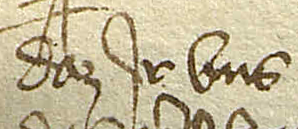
daʒ ir vns
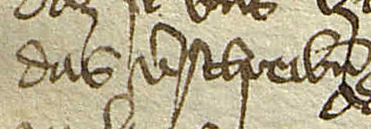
das v*ſchreibn*
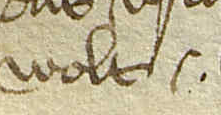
wolt / .
